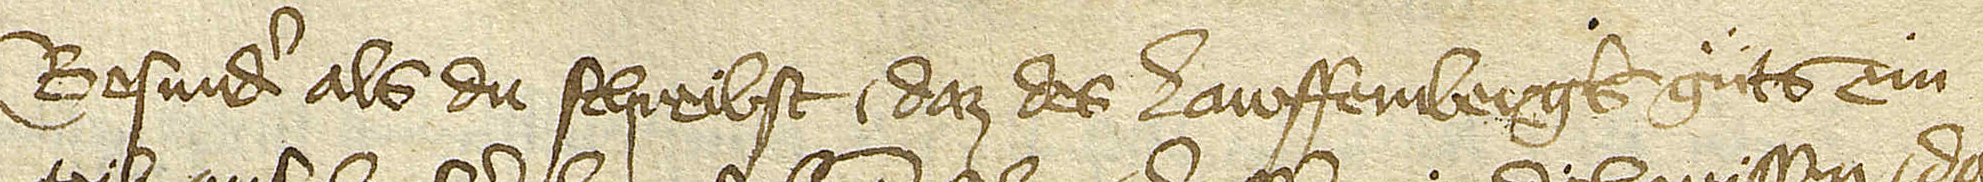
Beſund* als du ſchreibſt / daʒ des Lawffemberg*s güts ein
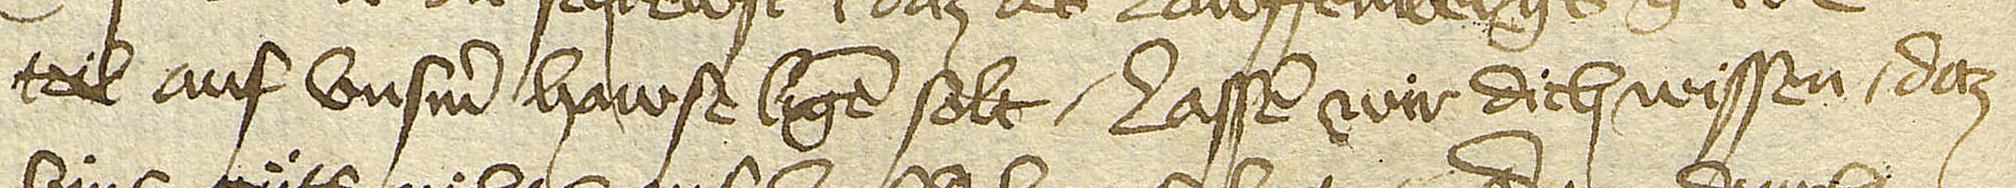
teil auf vnſm* hawſe lige* ſolt / Laſſe* wir dich wiſſen / daʒ
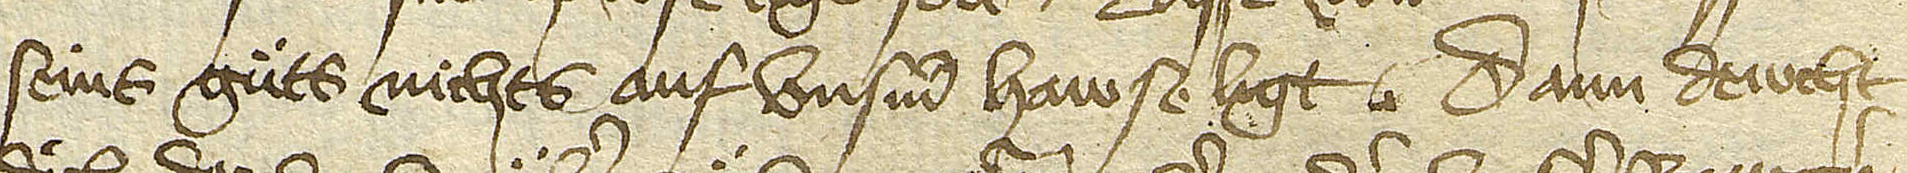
ſeins güts nichts auf vnſm* hawſe ligt / . Dann dewcht
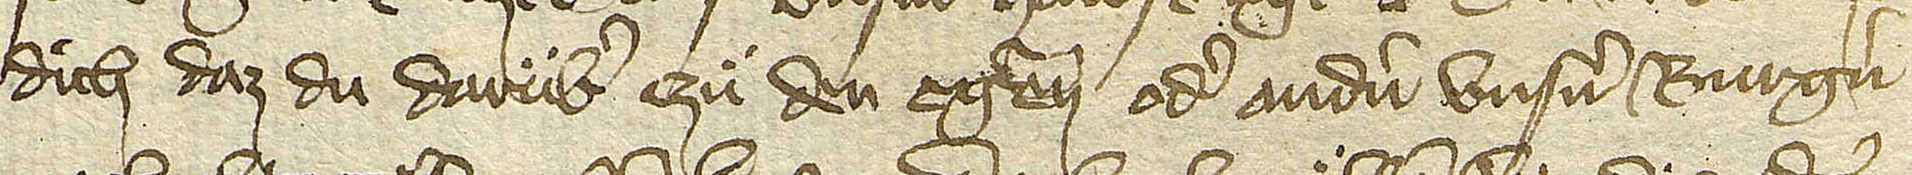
dich daʒ du darüb* cʒü den egen* od* andn* vnſn* Burgn*
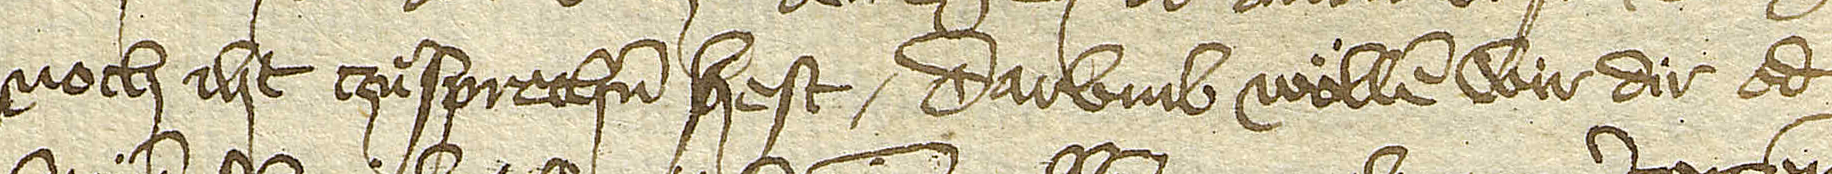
noch iht cʒüſprechn* heſt / Darvmb wölle* wir dir od*
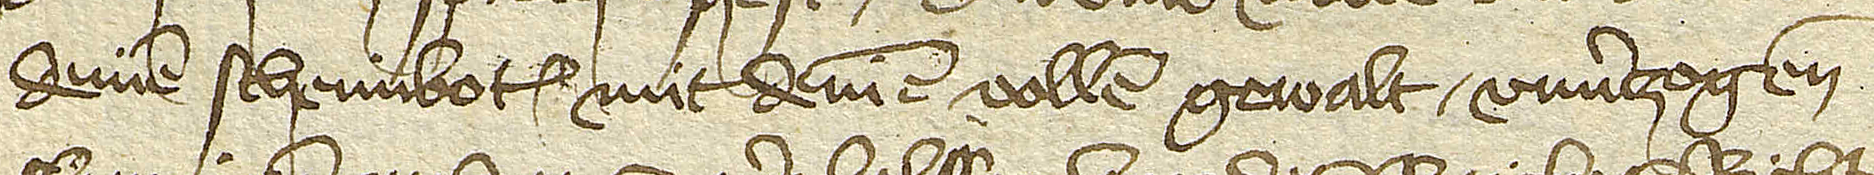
deine* ſcheimbot* mit deine* volle* gewalt / vnu*cʒogen*
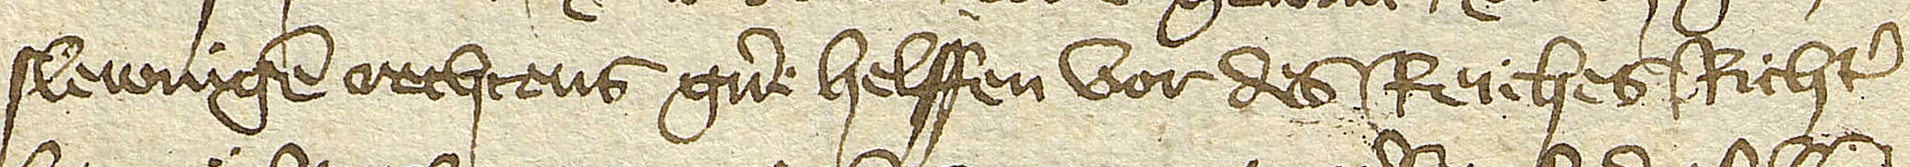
ſlewnige* rechtens gn*e helffen vor des Reiches Richt*
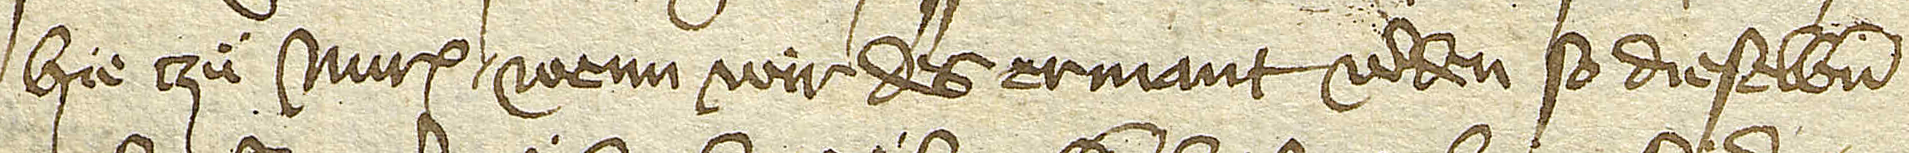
hie cʒü Nur* / wenn wir des ermant w*den ſo dieſelbn*
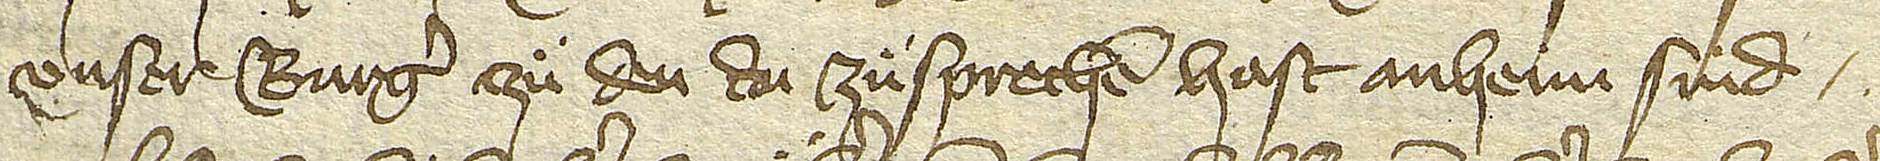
vnſer Burg* cʒü den du cʒüſpreche* haſt anheim ſind / .
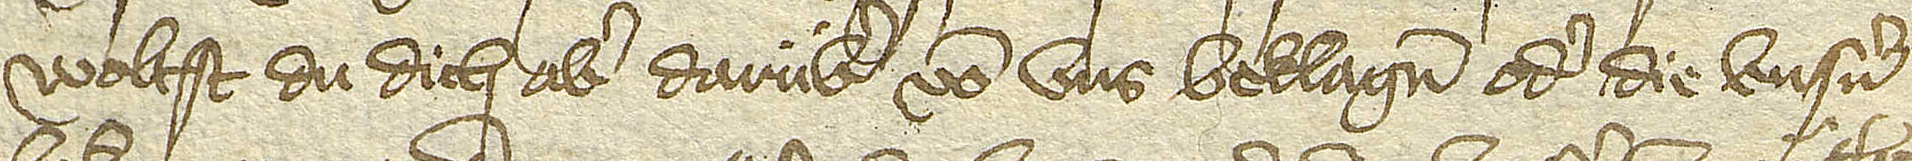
woltſt du dich ab* darüb* vo* vns beklagn* od* / die vnſn*
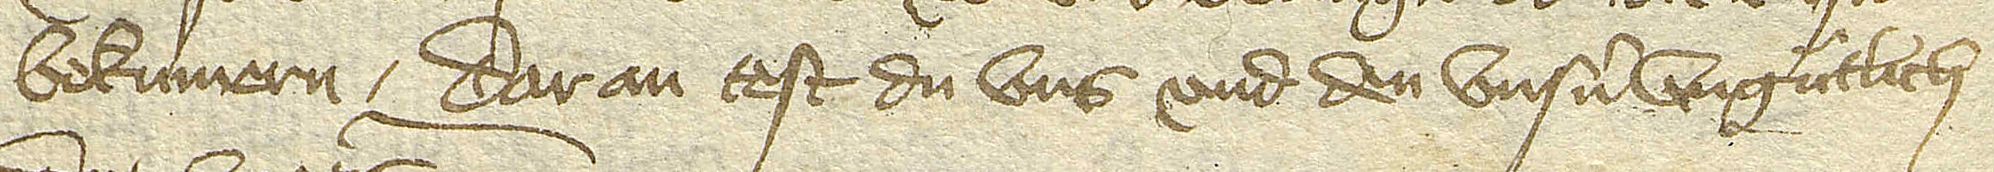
bekumern / Daran teſt du vns vnd den vnſn* vngütlich
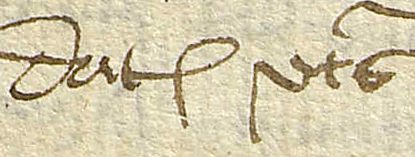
Dat* vts*
